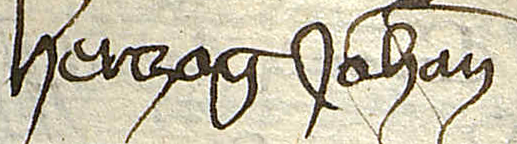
hercʒog Iohan*
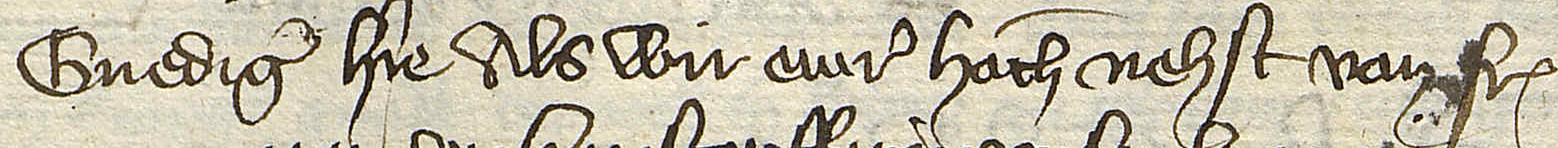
Gnedig* h*re als wir ewr* hoch* nehſt von fr*
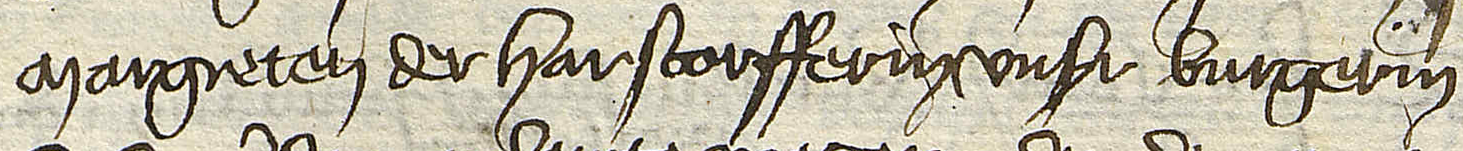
Margreten der harſtorfferin vnſ*r burgerin
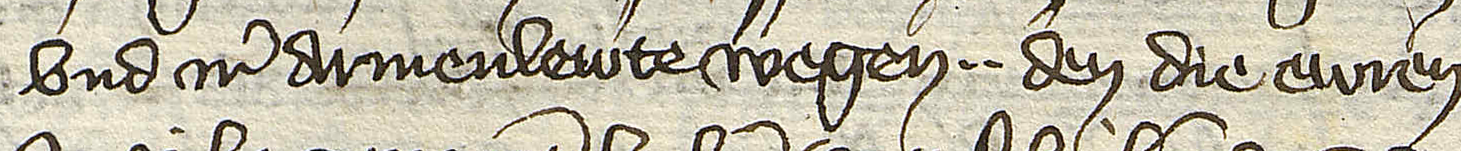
vnd ir* Armenlewte wegen ~ den die ewren
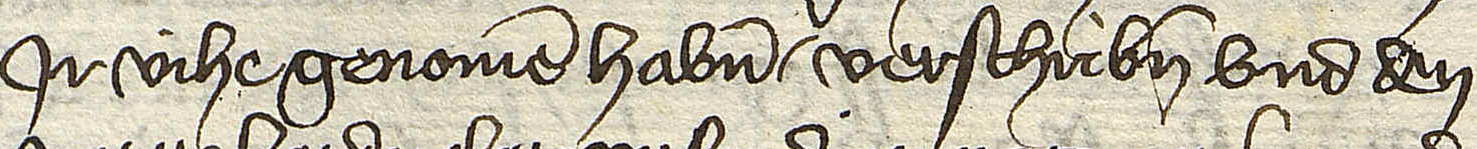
Ir vihe genome* habn* / verſchribn* vnd den
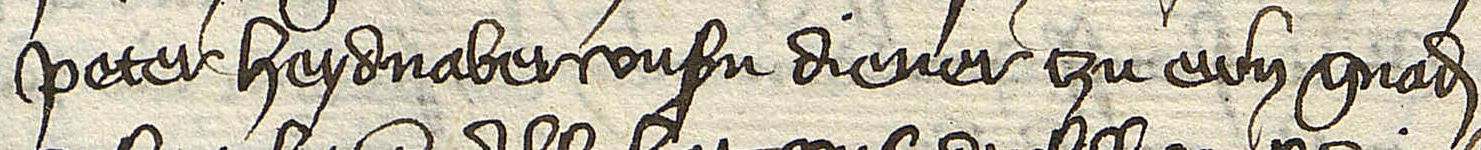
Peter heydnaber vnſ*n diener cʒu ewn* gnad*
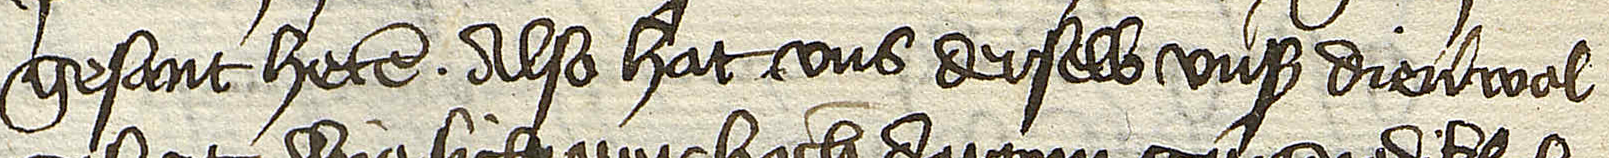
geſant hete* . Alſo hat vns derſelb vnſ* dien* wol
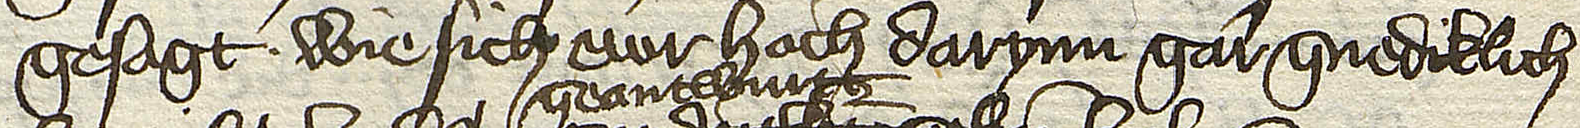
geſagt . wie ſich ewr hoch* darynn gar gnediklich
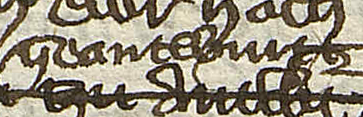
geantwurtt
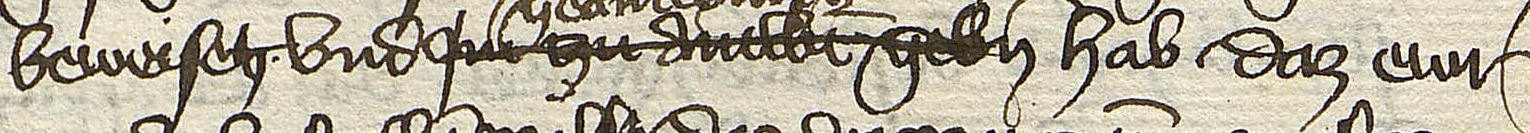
beweiſet . vnd Im cʒu antw*t gebn* hab / daʒ ewr
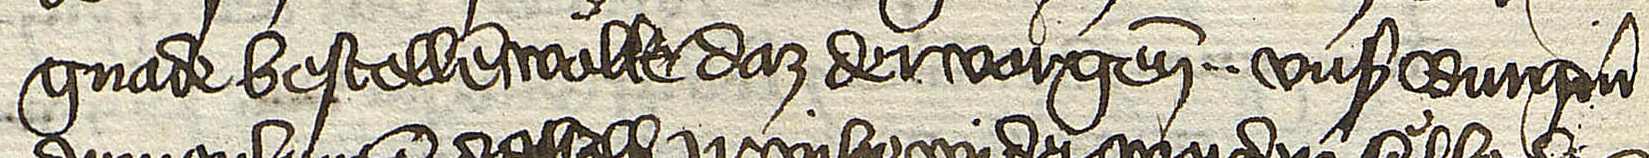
gnade beſtelle* wölle / daʒ der vorgen* ~ vnſ* Burgin*
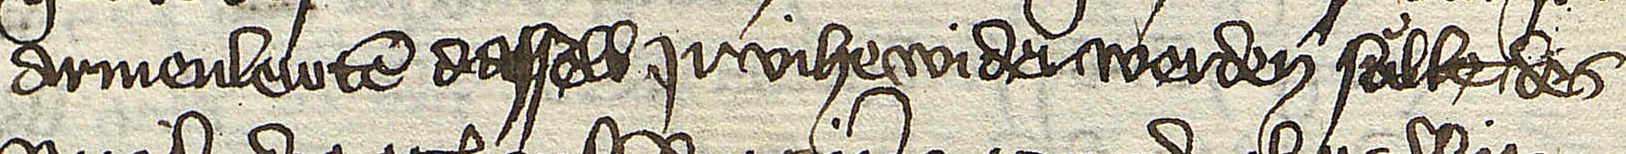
Armenlewte* daſſelb Ir vihe wider werden ſölle / des
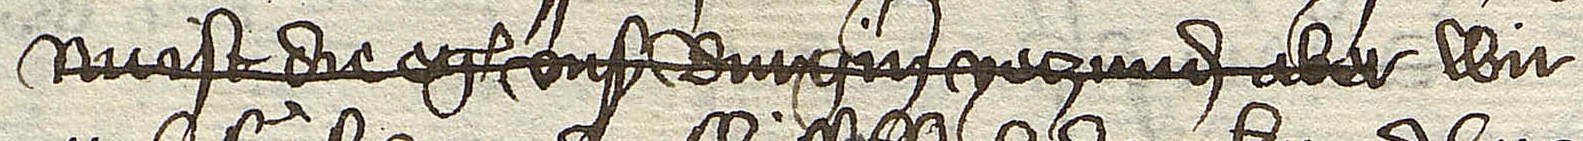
Nu iſt die eg* vnſ* Burgin* yecʒund* aber wir
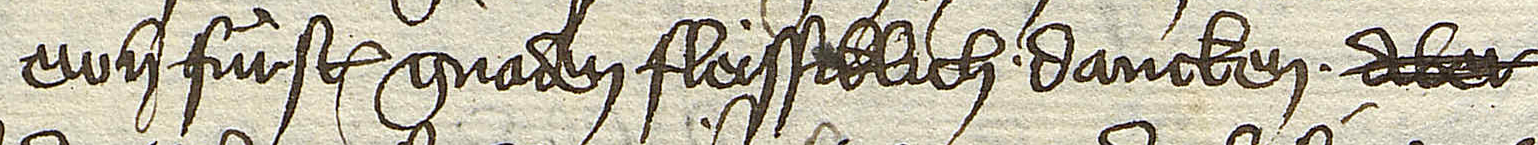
ewn* fürſt* gnaden fleiſſiklich . dancken . Aber
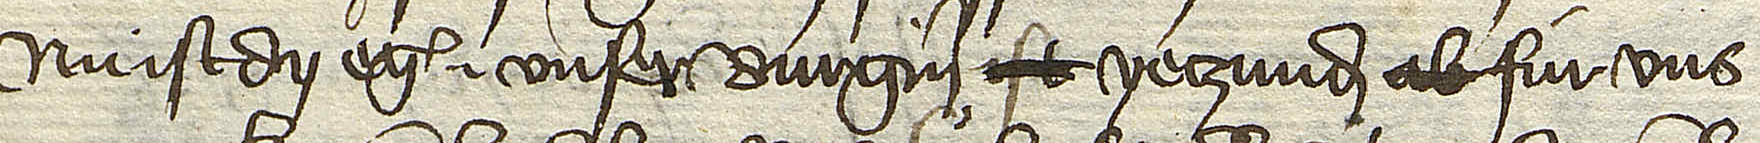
Nu iſt dy eg* ~ vnſer Burgin* iſt yecʒund* ab für vns
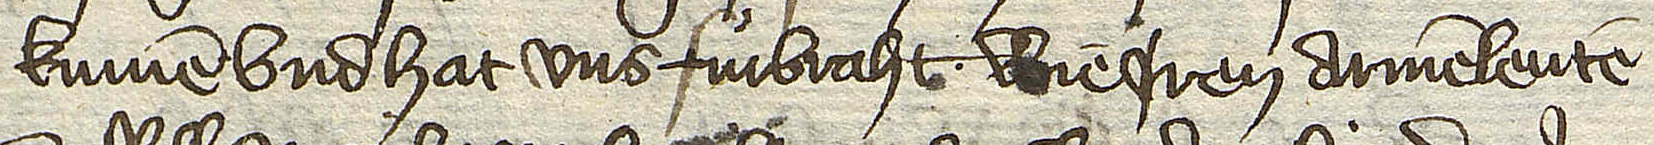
kume* vnd hat vns fürbraht . wie Iren Arme*leute*
